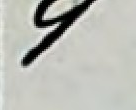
9
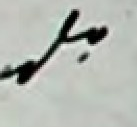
do
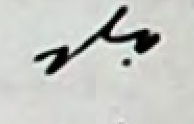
do
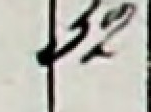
52
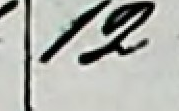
12
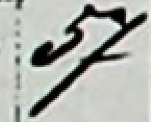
57
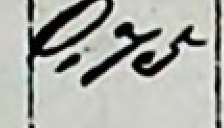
0,75
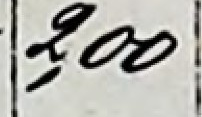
2,00
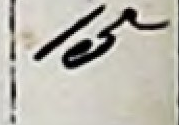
15
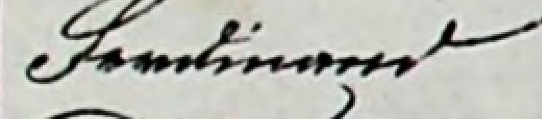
Ferdinand
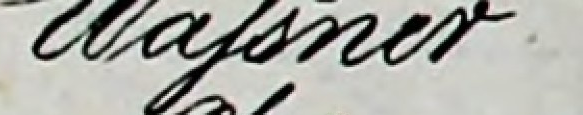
Wassner
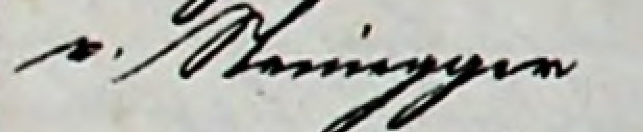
v. Steinegger
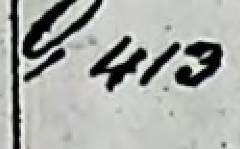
0,413
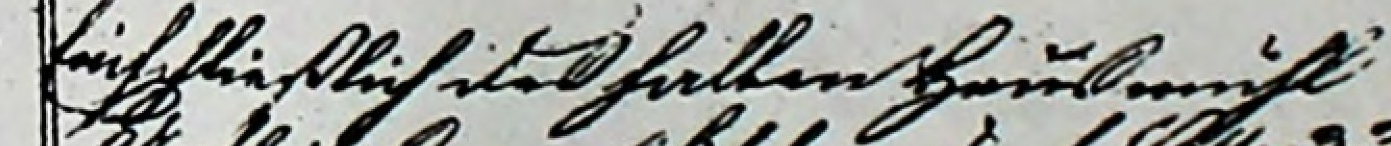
Einschließlich des halben Hausmühl
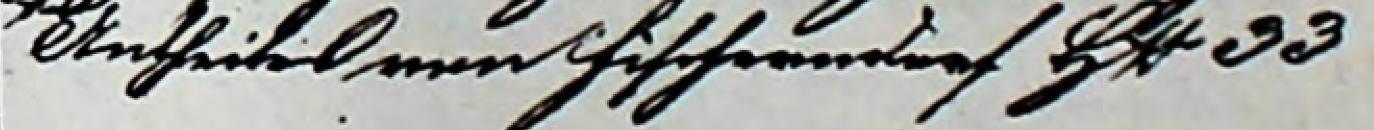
Antheiles von Fischerndorf H? 33
